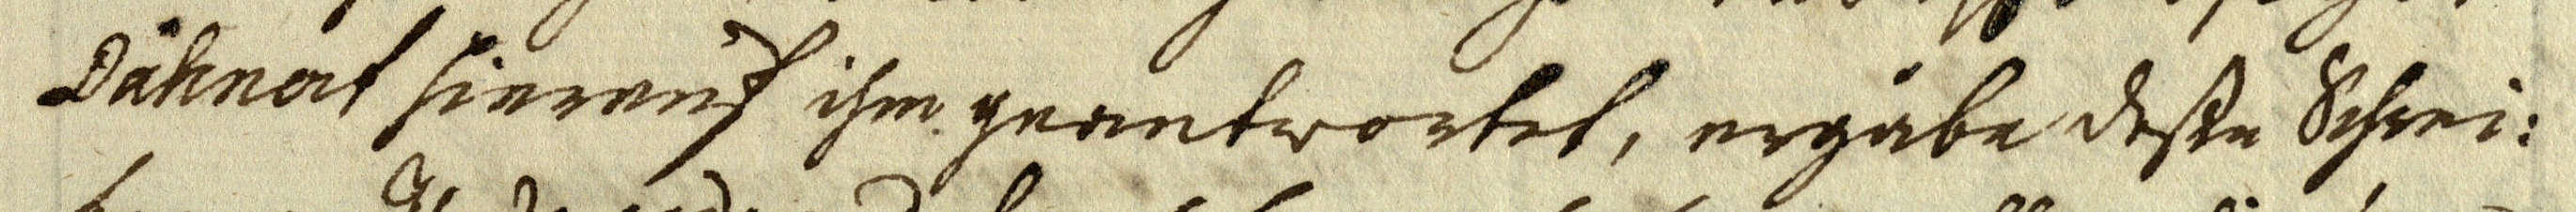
Dähnert hierauf ihm geantwortet, ergäbe deßen Schrei¬
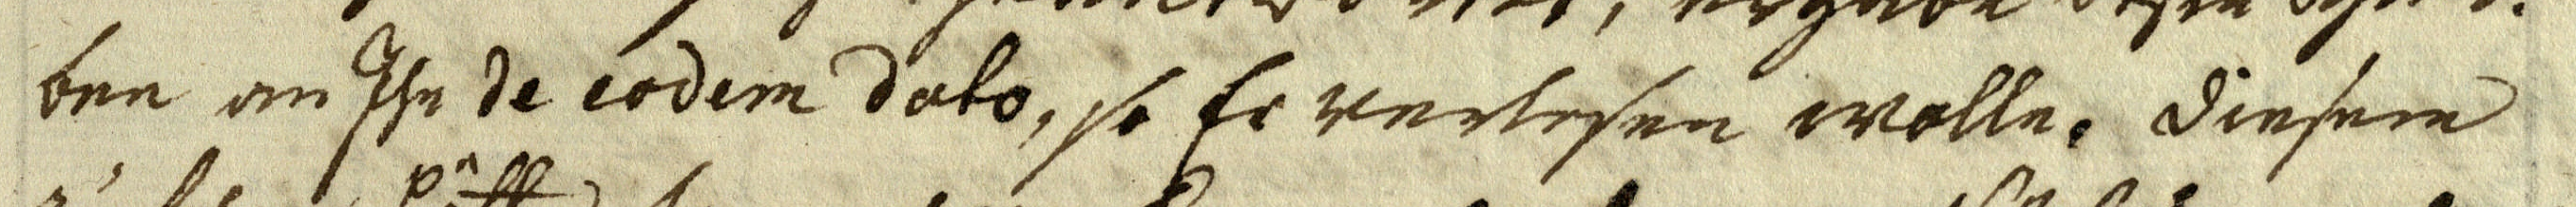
ben an Ihn de eodem dato, so Er verlesen wolle. Diesem
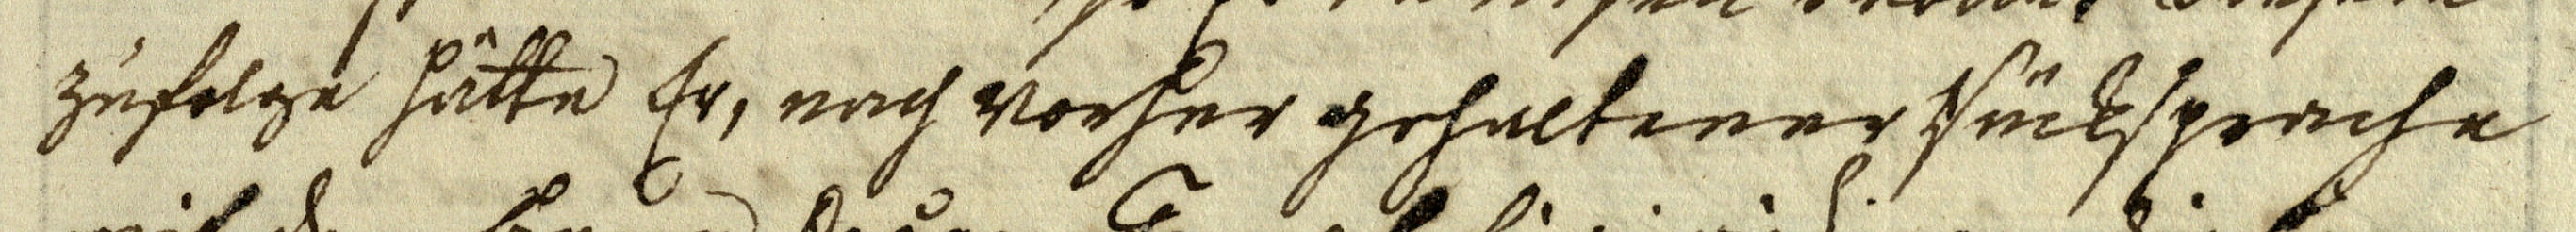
zufolge hätte Er, nach vorher gehaltener Rücksprache
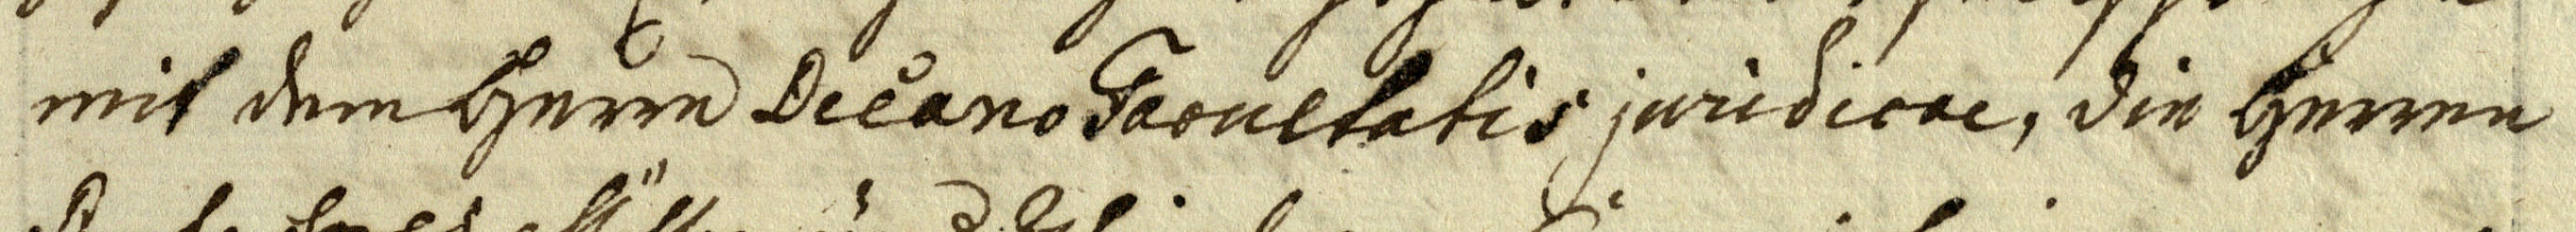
mit dem Herrn Decano Facultatis juridicae, die Herren
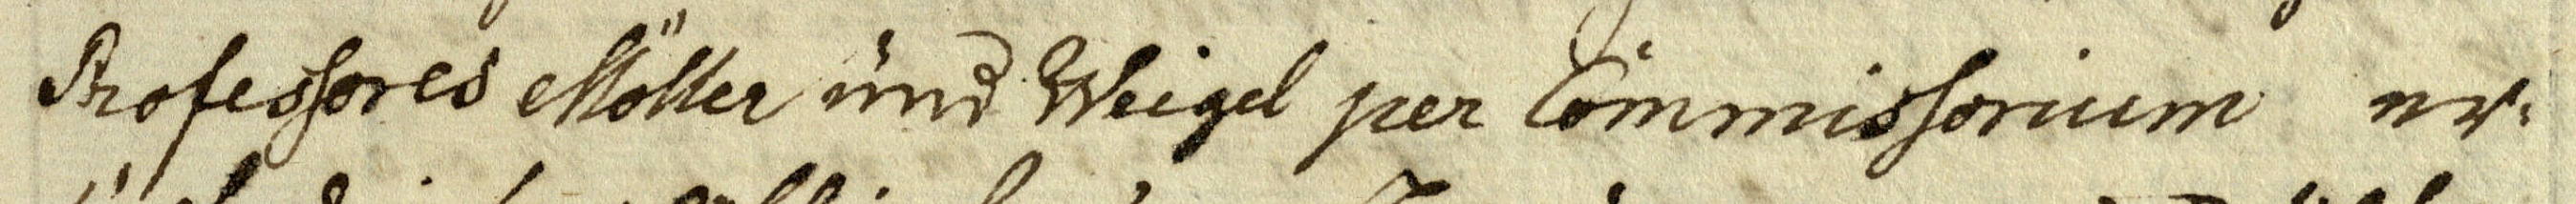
Professores Möller und Weigel per Commissorium er¬
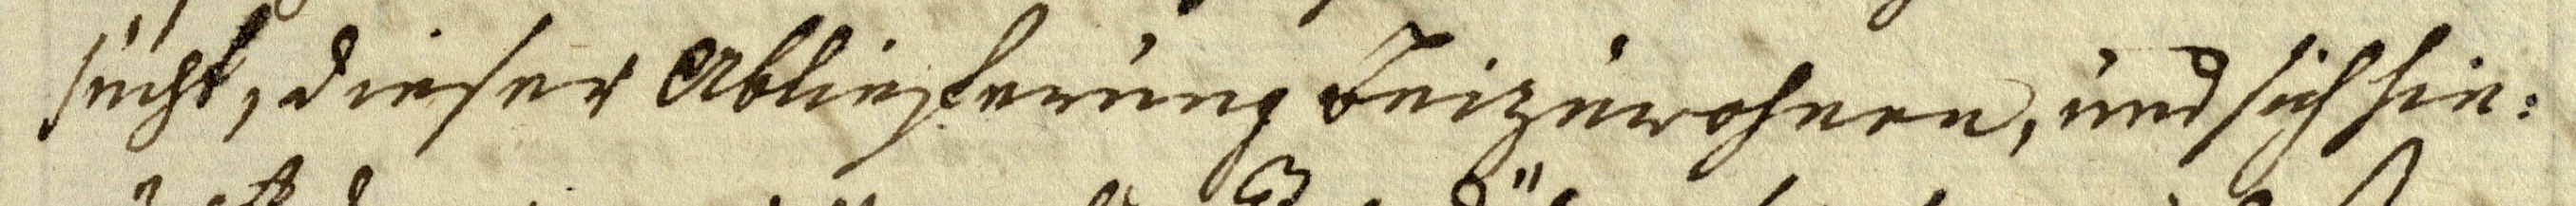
sucht, dieser Ablieferung beizuwohnen, und sich hie¬
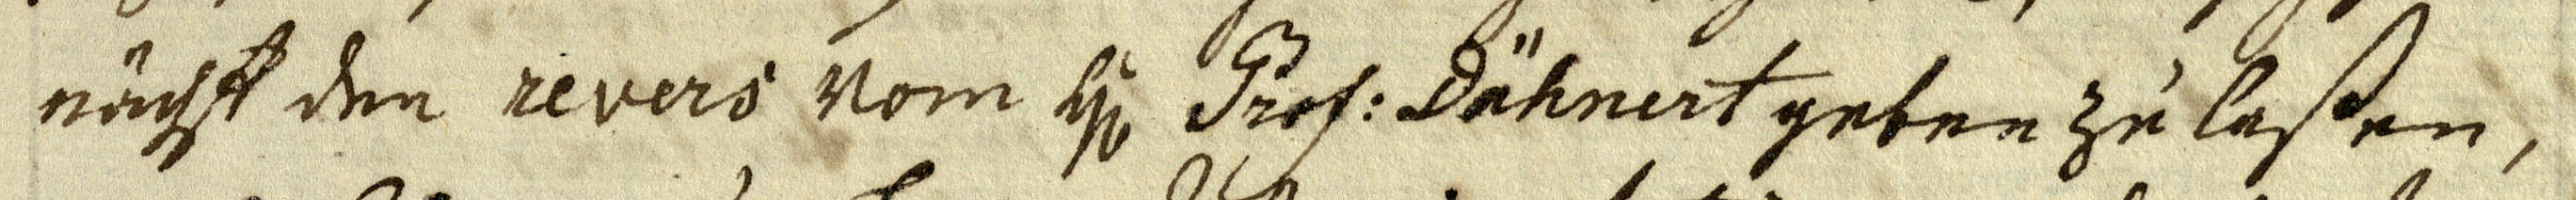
nächst dem revers vom H. Prof. Dähnert geben zu lasen,
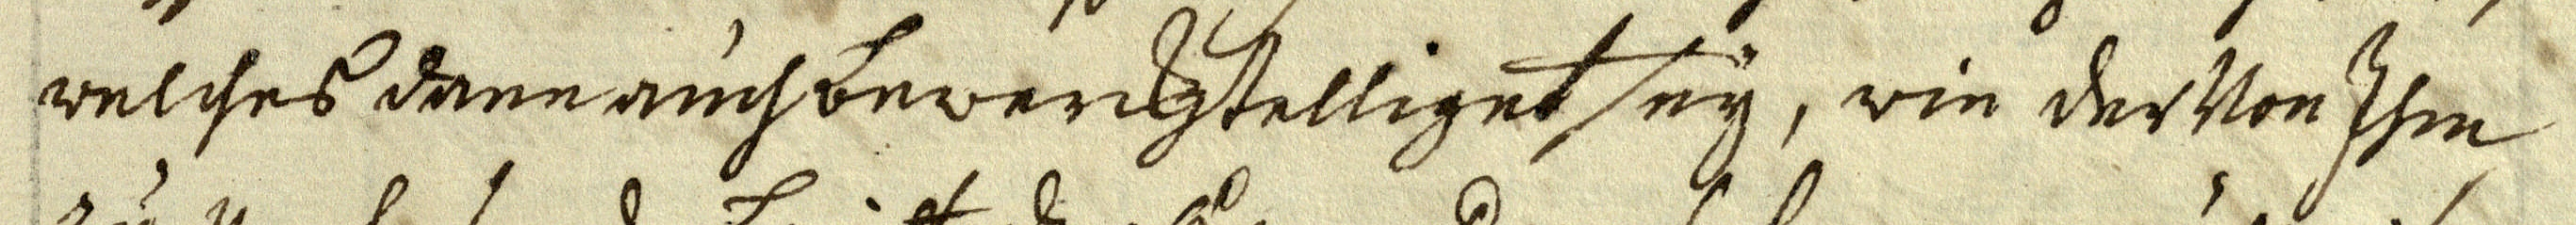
welches denn auch bewerckstelliget seÿ, wie der von Ihm
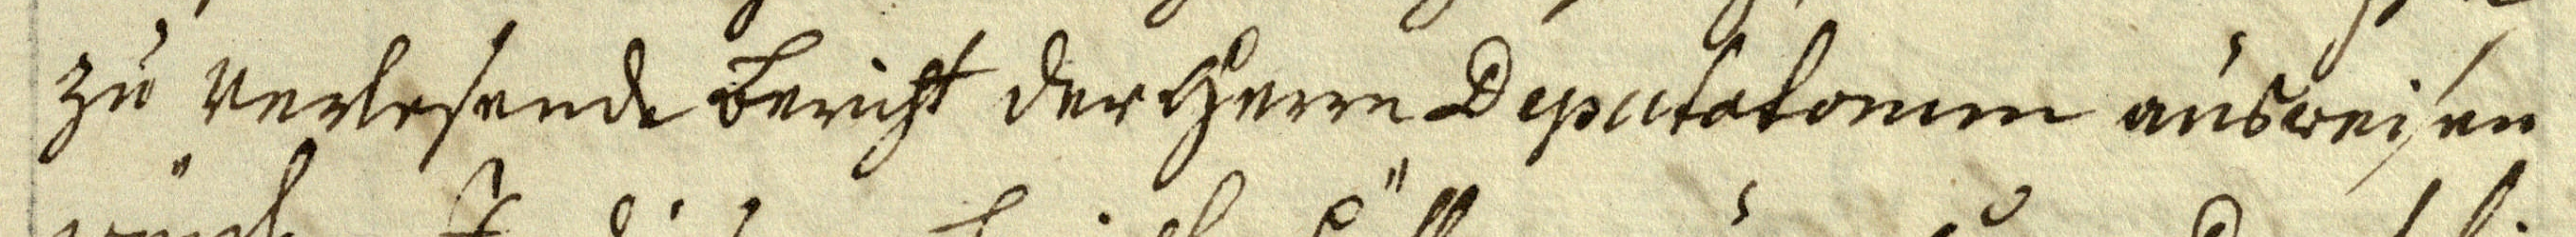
zu verlesende Bericht der Herrn Deputatorum ausweisen
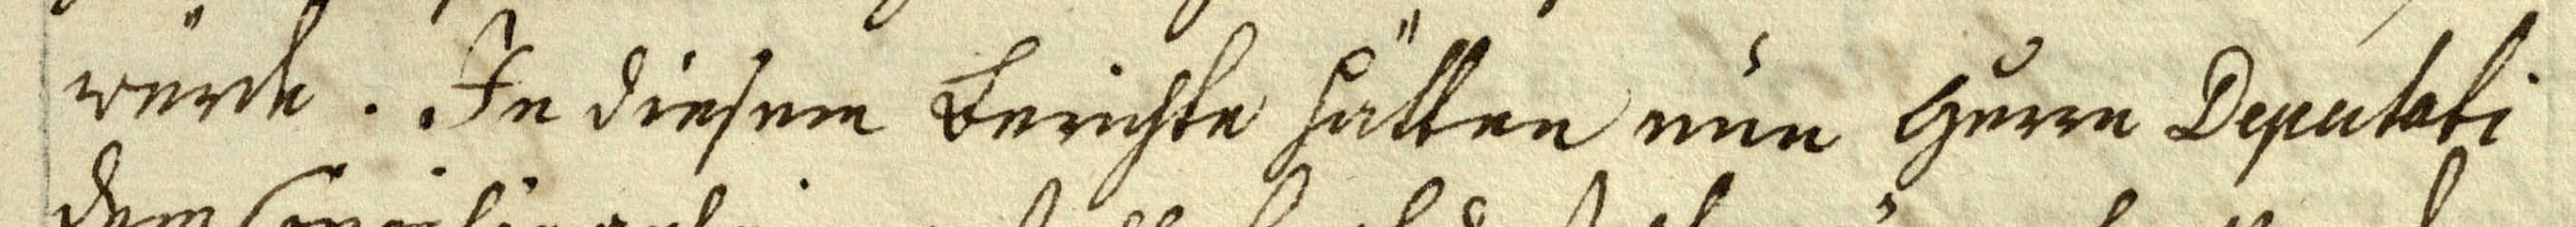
würde. In diesem Berichte hätten nun Herrn Deputati
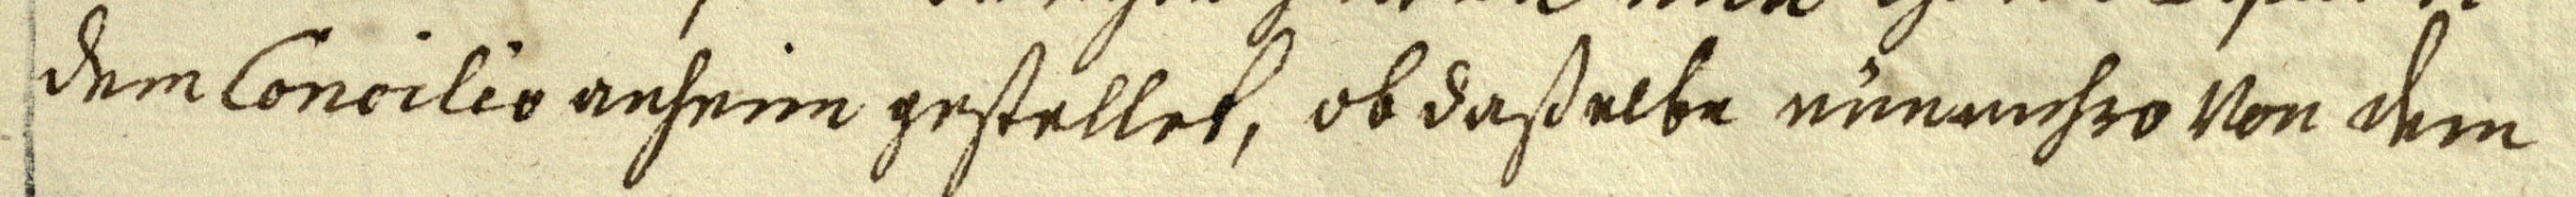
dem Concilio anheim gestellet, ob daßelbe nunmehro von dem
